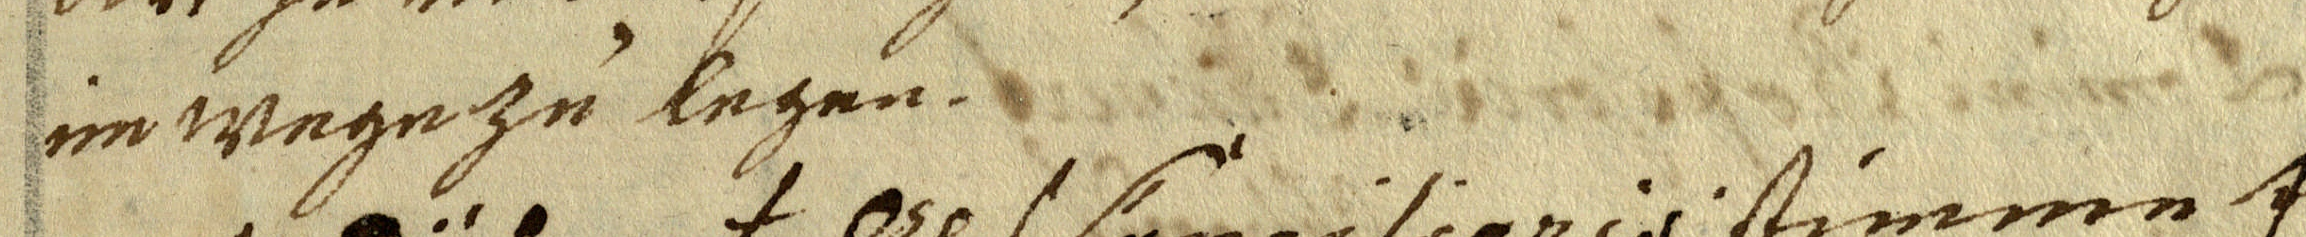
im Wege zu legen.
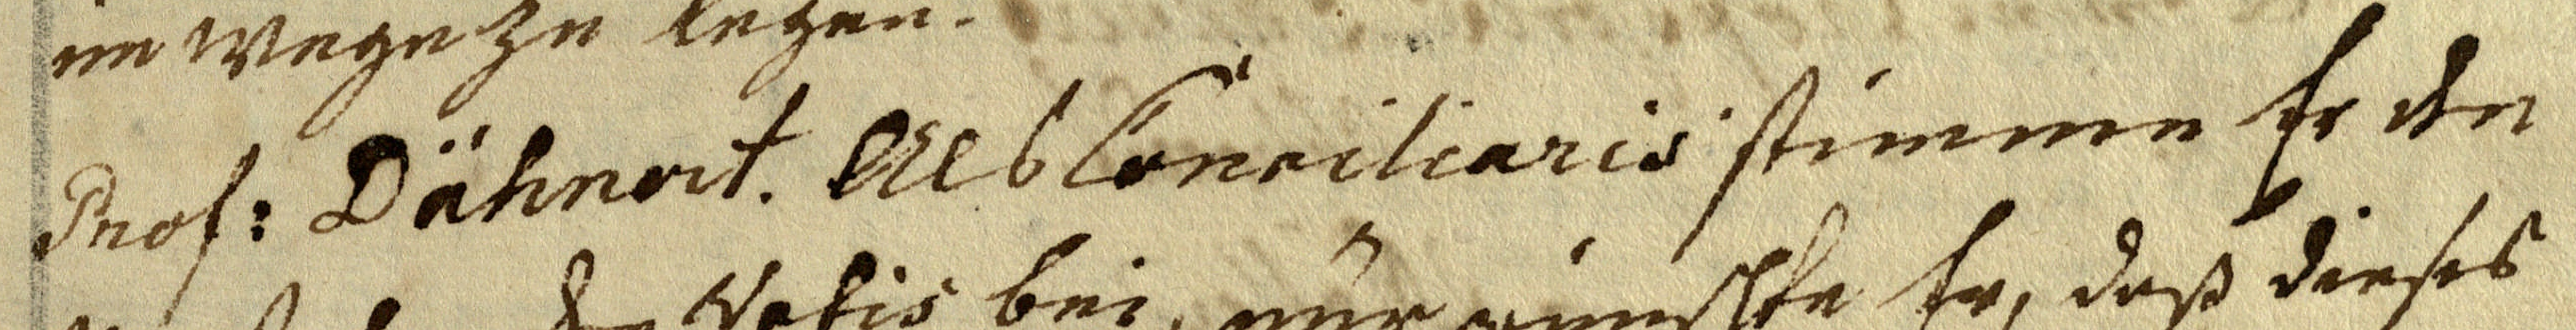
dh Prof. Dähnert. Als Conciliaris stimme Er den
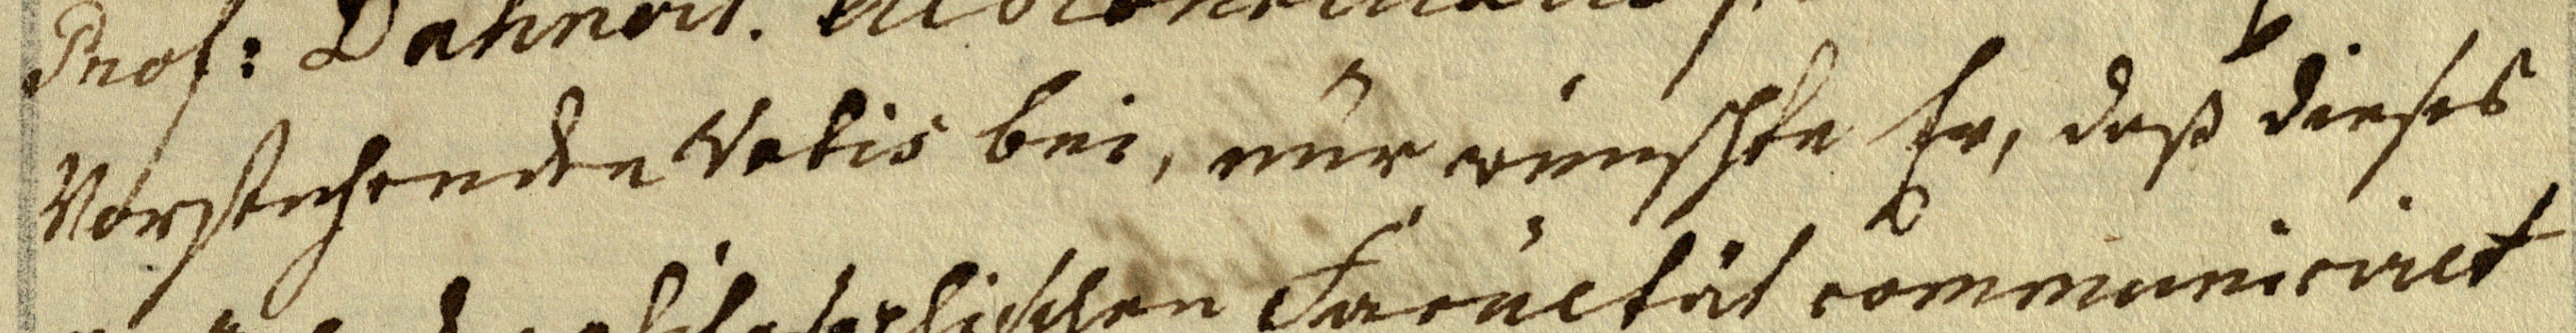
vorstehenden Votis bei, nur wünschte Er, daß dieses
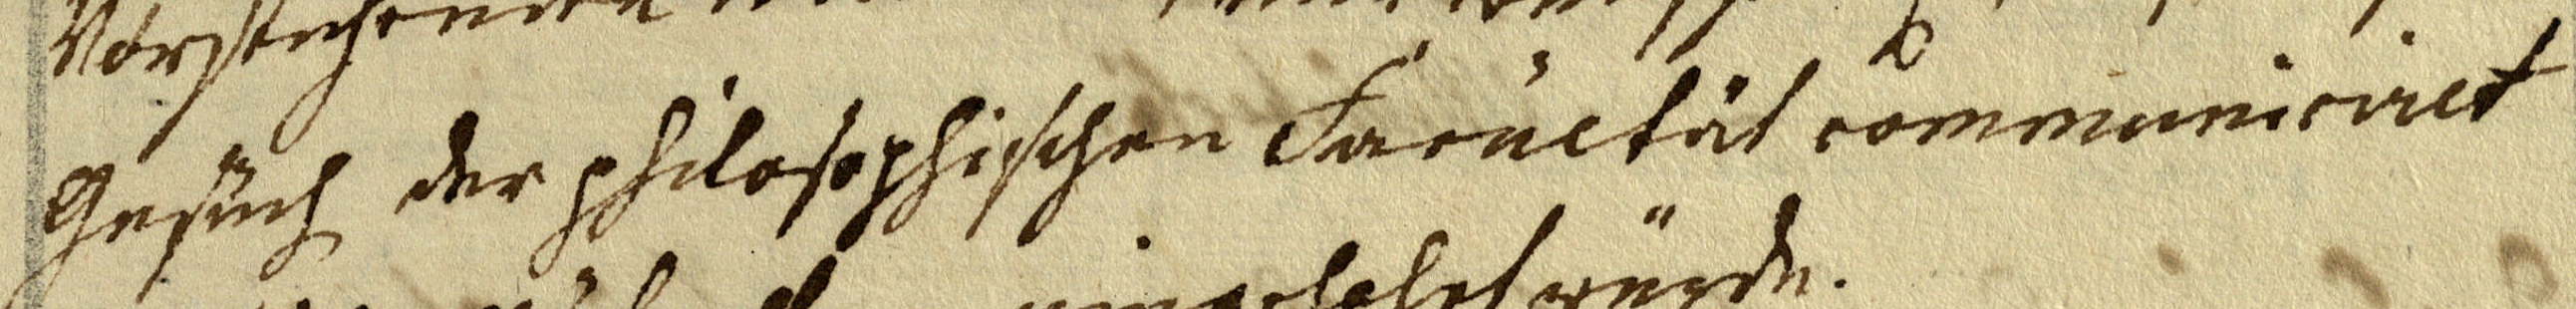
Gesuch der philosophischen Facultät communiciret
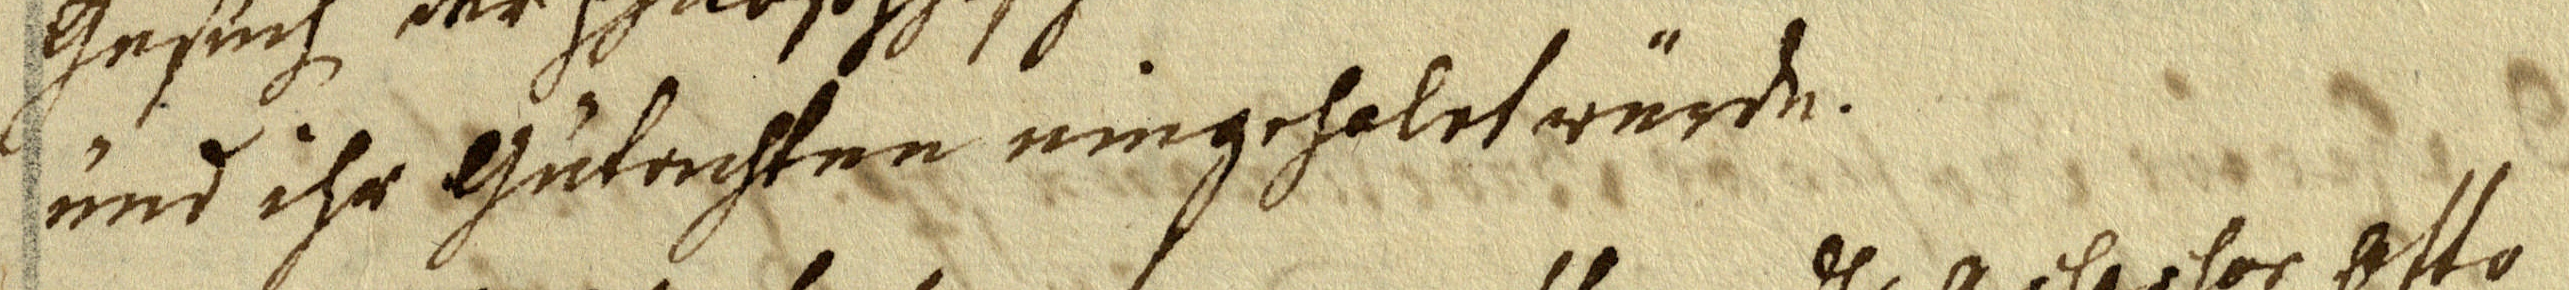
und ihr Gutachten eingeholet würde.
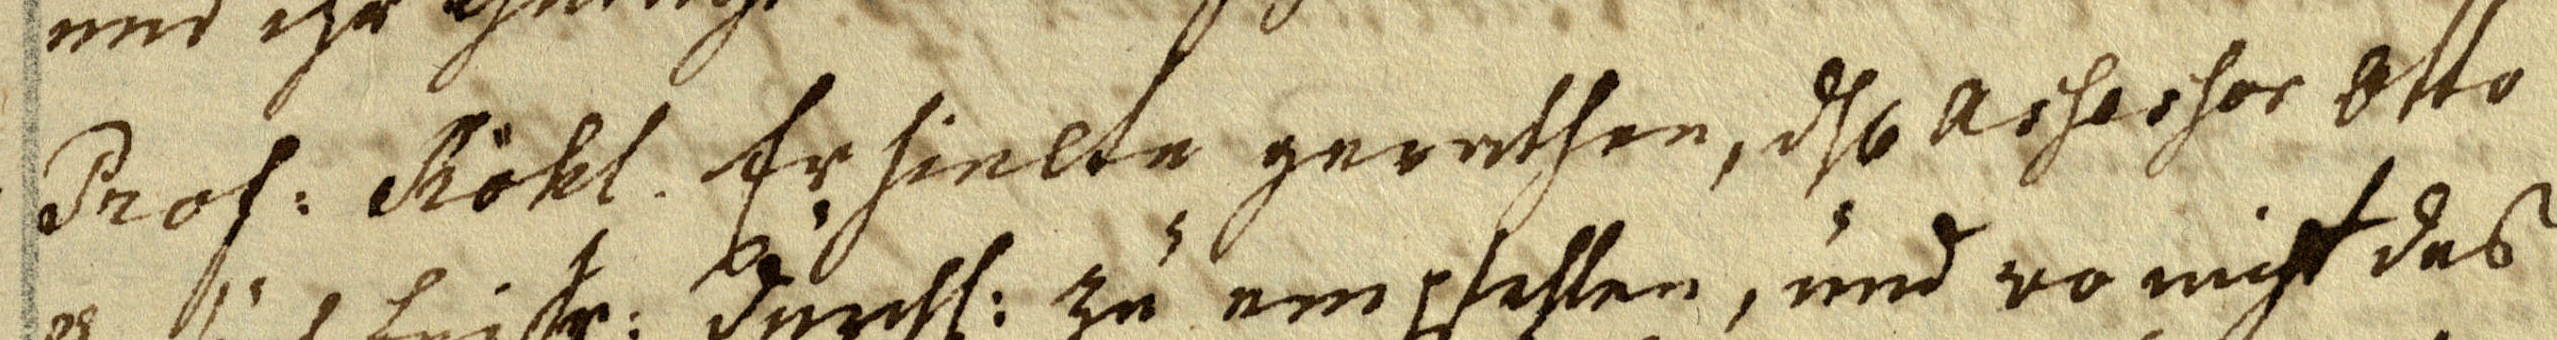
dh Prof. Röhl. Er hielte für gerathen, dh Assessor Otto
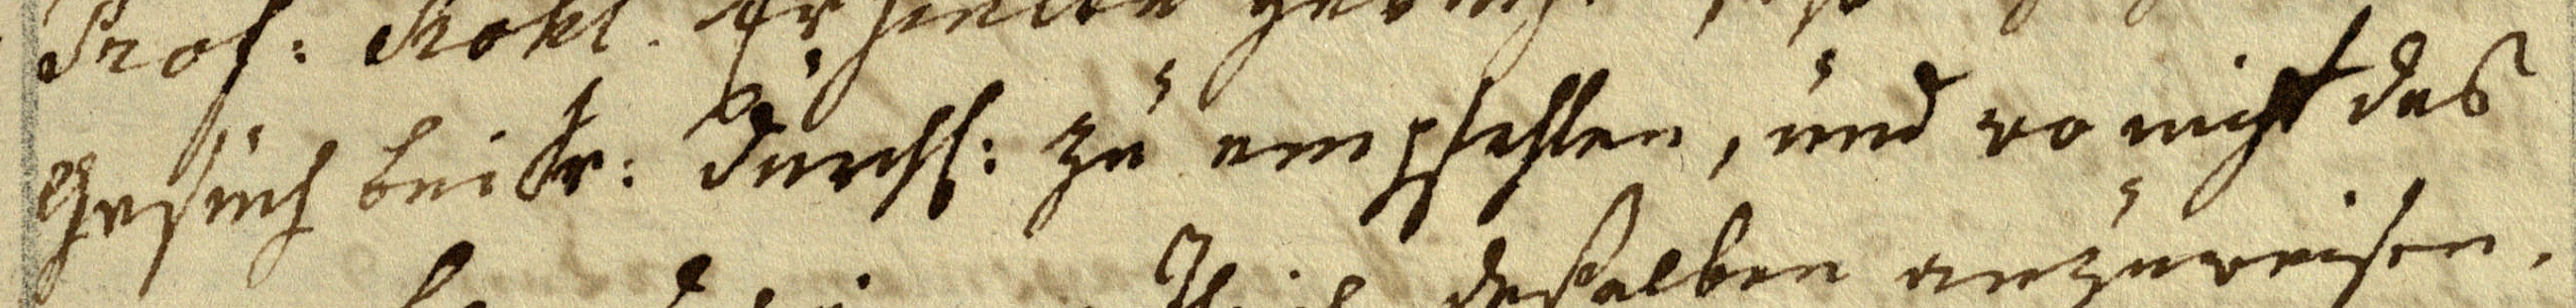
Gesuch bei Sr. Durchl. zu empfehlen, und wo nicht das
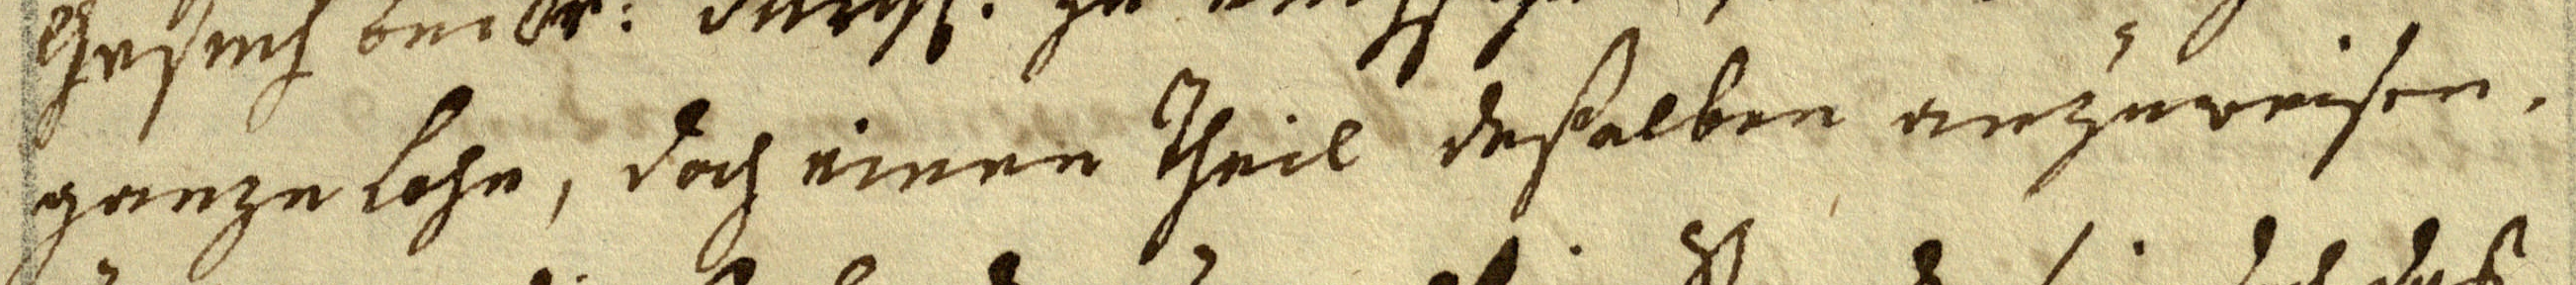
ganze Lohn, doch einen Theil deßelben anzuweisen,
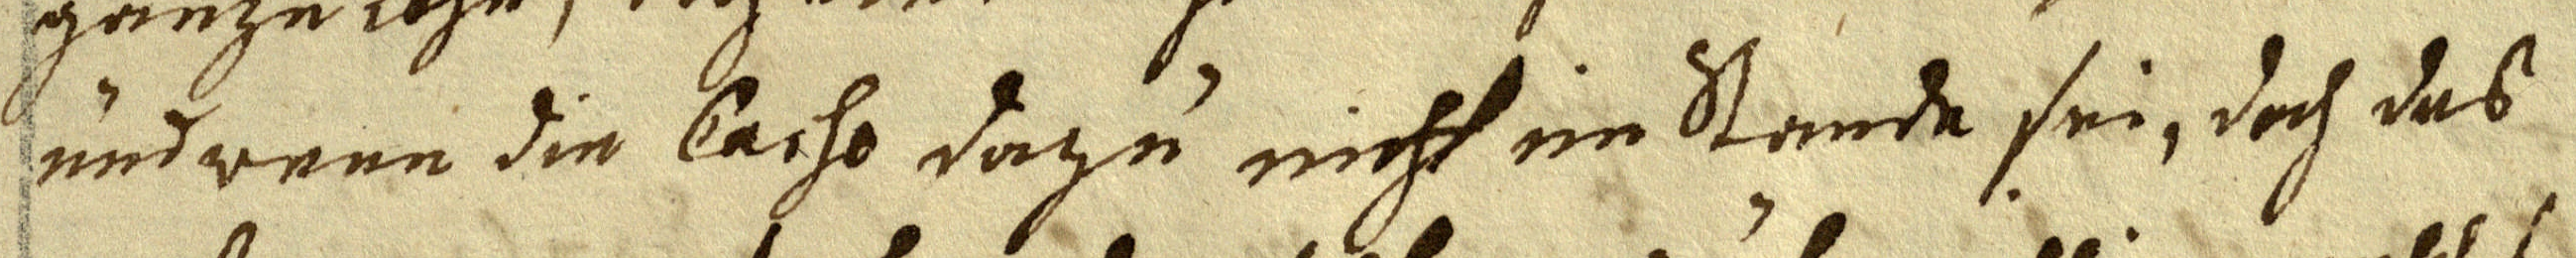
und wenn die Casse dazu nicht im Stande sei, doch das
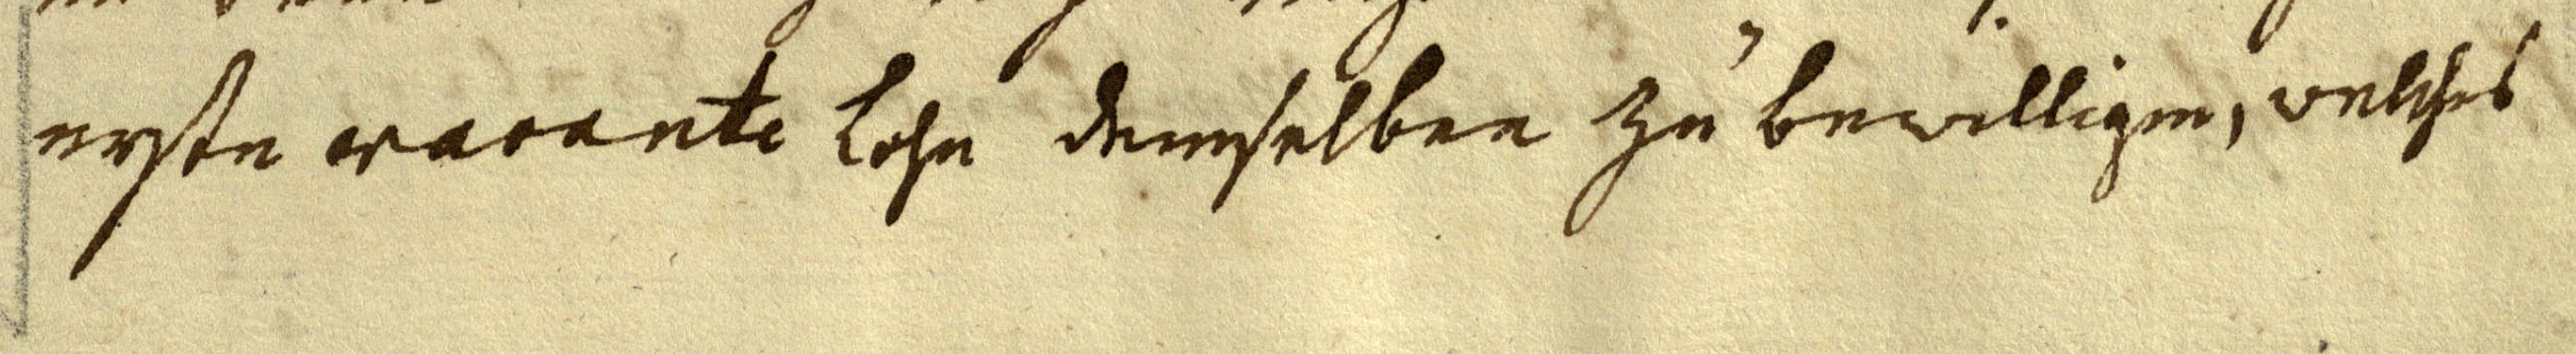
erste vacante Lohn demselben zu bewilligen, welches
